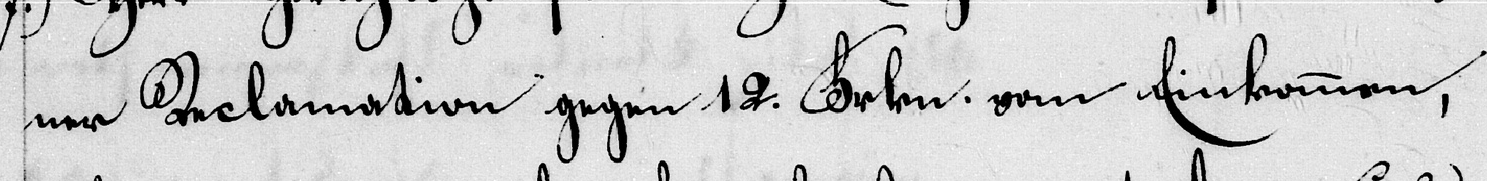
ner Reclamation gegen 12. Frkn. vom Einkommen,
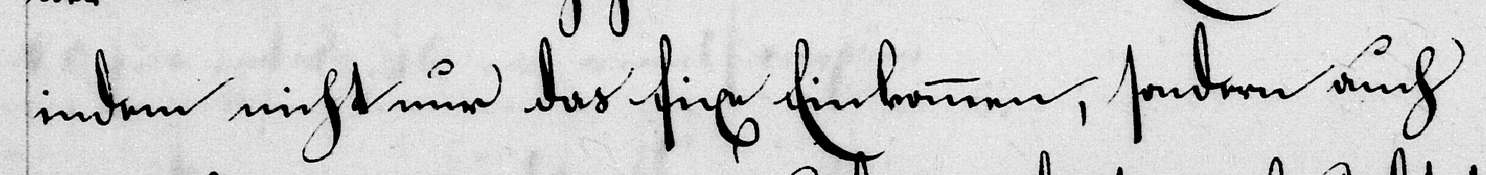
indem nicht nur das fixe Einkommen, sondern auch
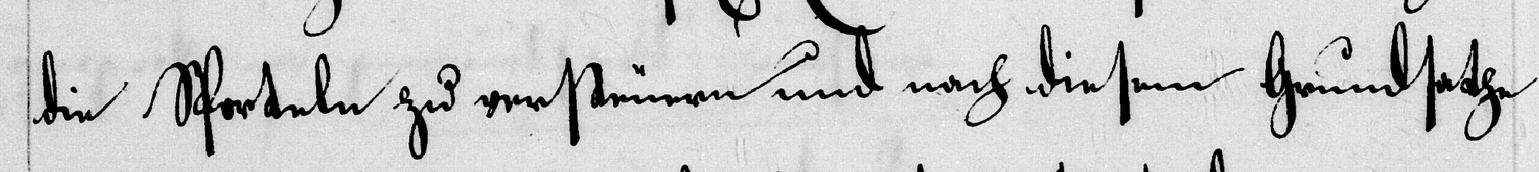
die Sporteln zu versteuern und nach diesem Grundsatze
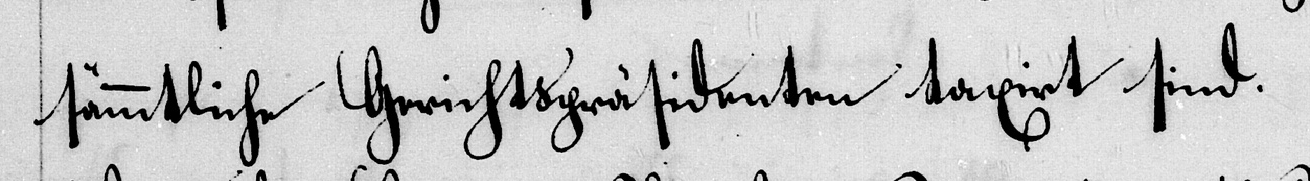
sämmtliche Gerichtspräsidenten taxirt sind.
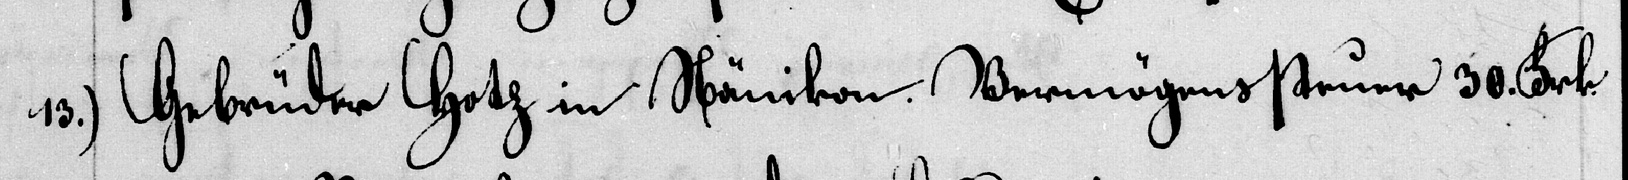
13.) Gebrüder Hotz in Nänikon. Vermögenssteuer 30. Frk.
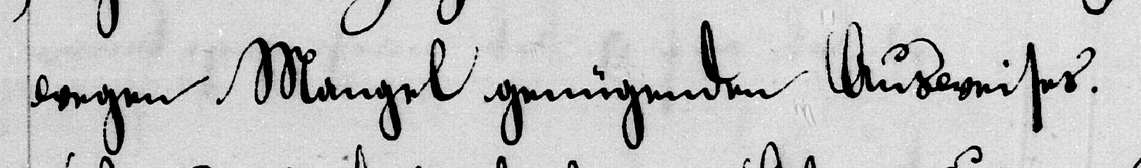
wegen Mangel genügenden Ausweises.
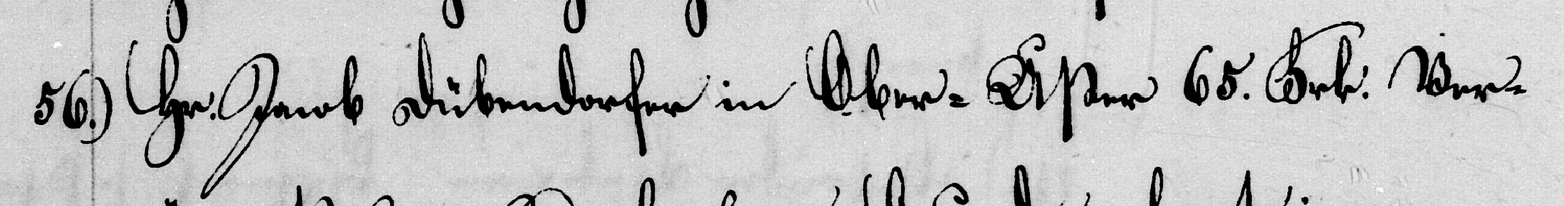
56.) Hr. Jacob Dübendorfer in Ober-Uster 65. Frk. Ver¬
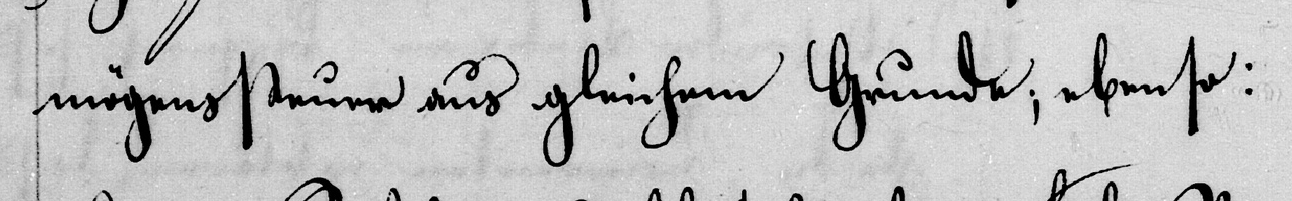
mögenssteuer aus gleichem Grunde; ebenso:
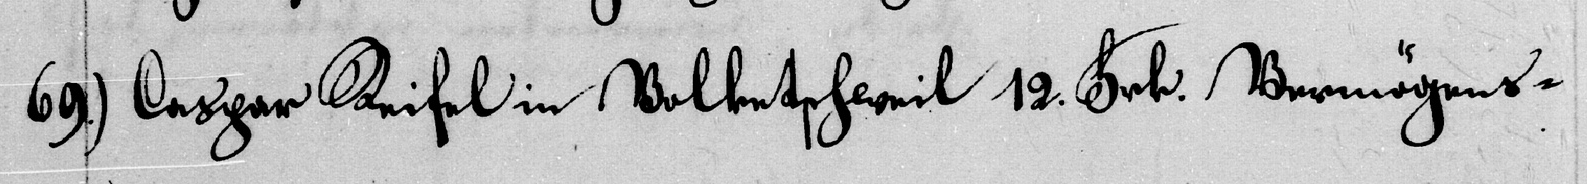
69.) Caspar Reifel in Volkentschweil 12. Frk. Vermögens¬
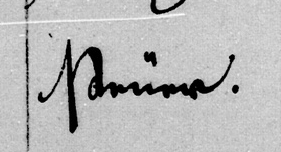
steuer.
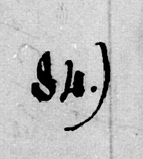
124.)
